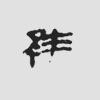隹
